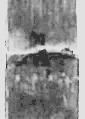七
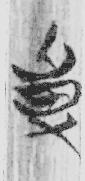尃
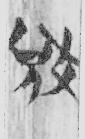敓（說）
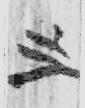之
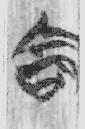命
